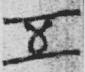五
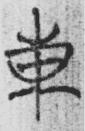東
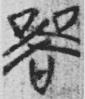○（鄰）
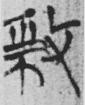殺
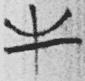牛
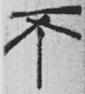不
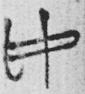女（如）
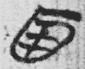西
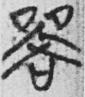○（鄰）
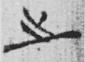之
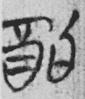酌
